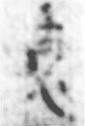黃
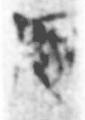所
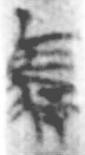馭（御）
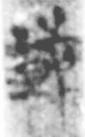軒
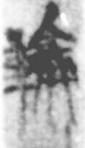輪
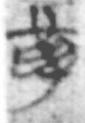革
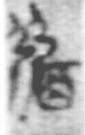弼
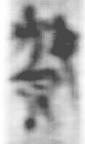○（紛）
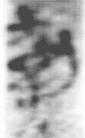韌
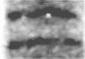二
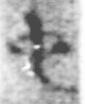屯
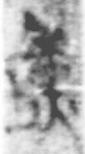○（纁）
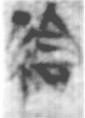○（組）
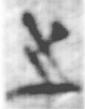之
